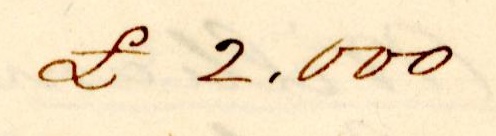£ 2,000
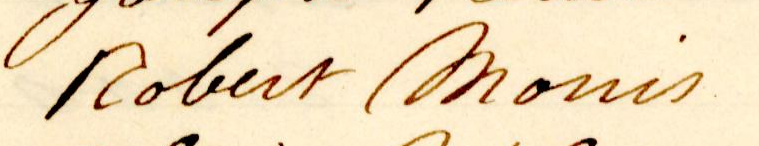Robert Morris
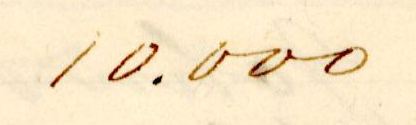10,000
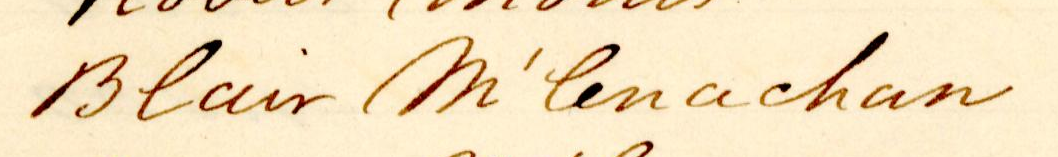Blair M'lenachan
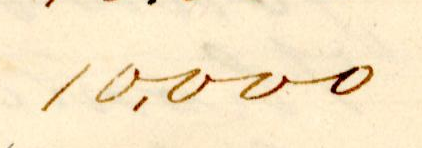10,000
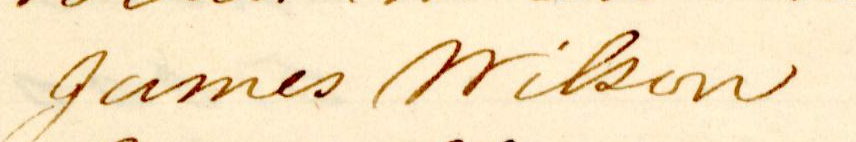James Wilson
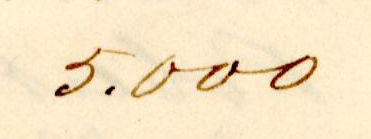5,000
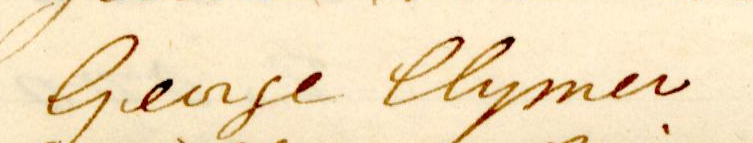George Clymer
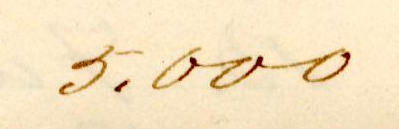5,000
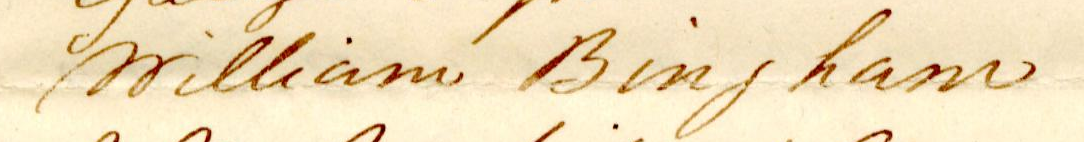William Bingham
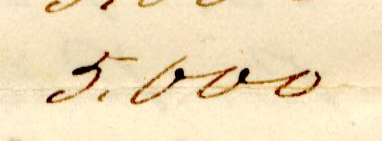5,000
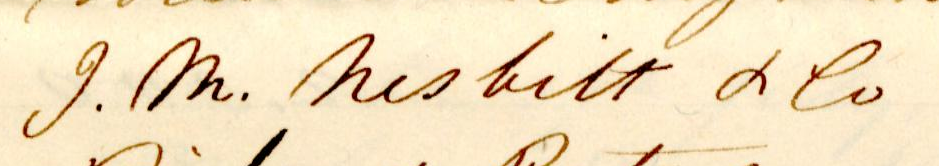J. M. Nesbitt & Co
